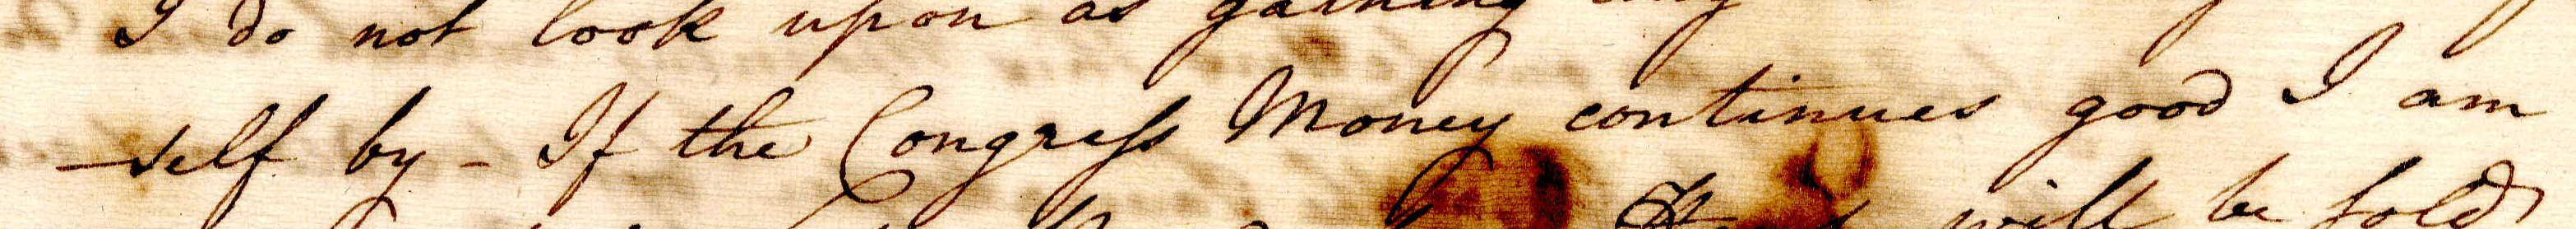-self by. If the Congress Money continues good I am
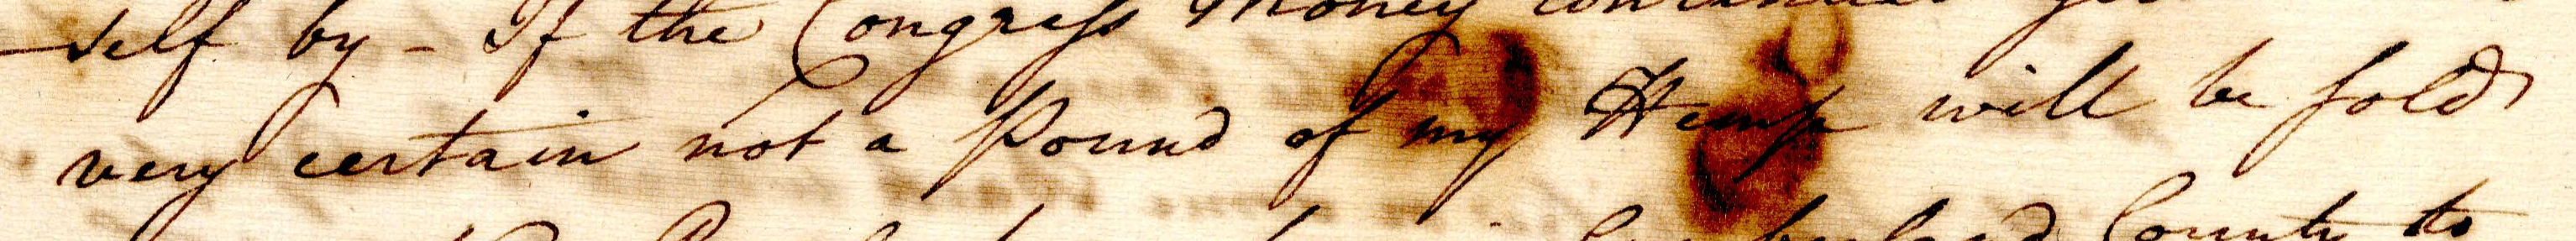very certain not a pound of my Hemp will be sold
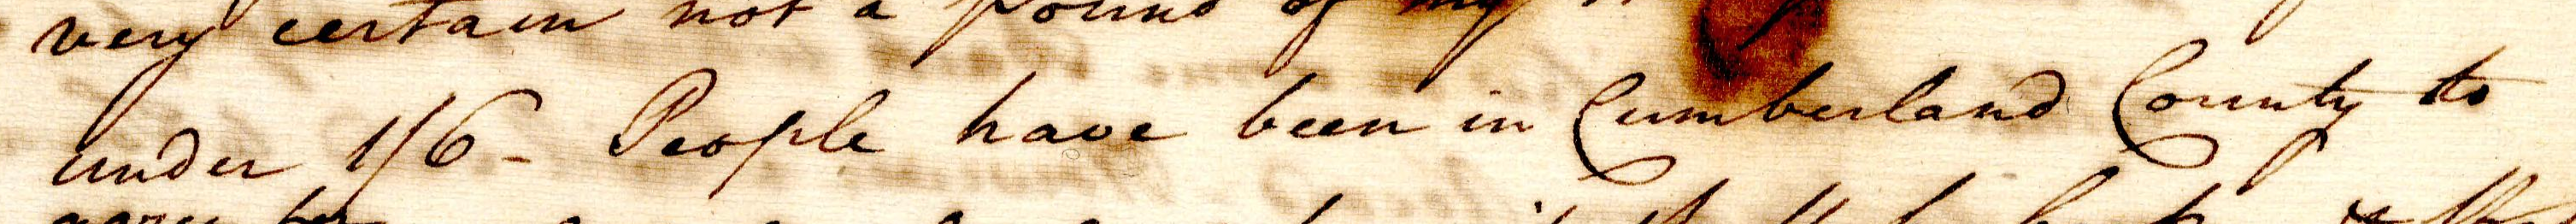under 1s6- People have been in Cumberland County to
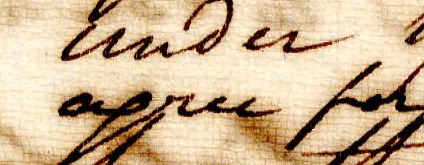agree for
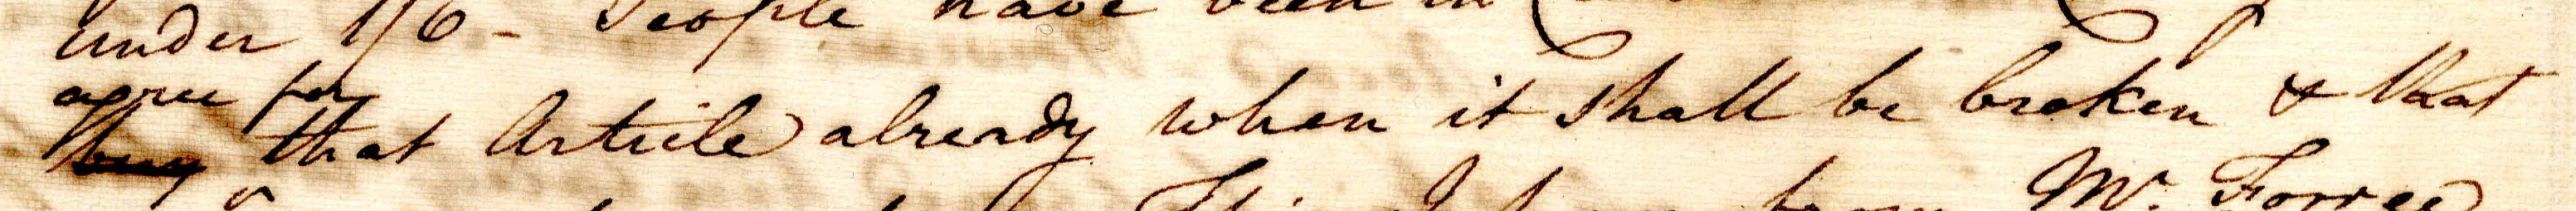they ^ that Article already when it shall be broken & that
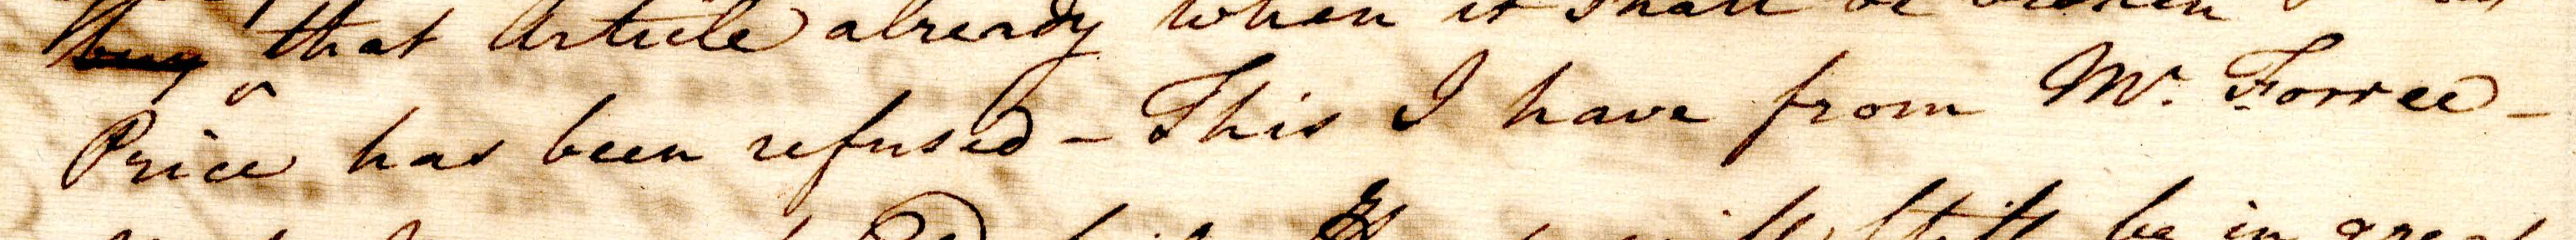Price has been refused- This I have from M^r. Forree-
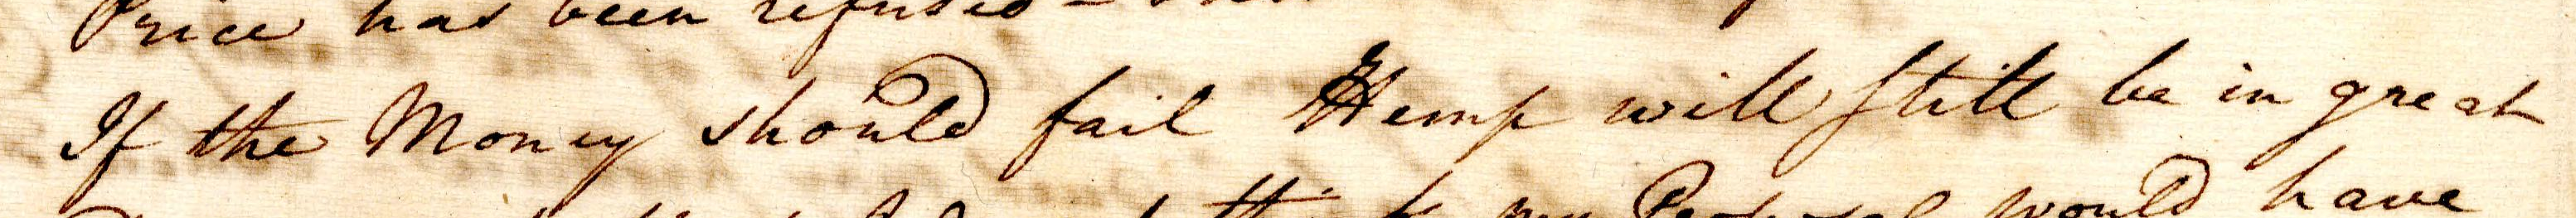If the Money should fail Hemp will still be in great
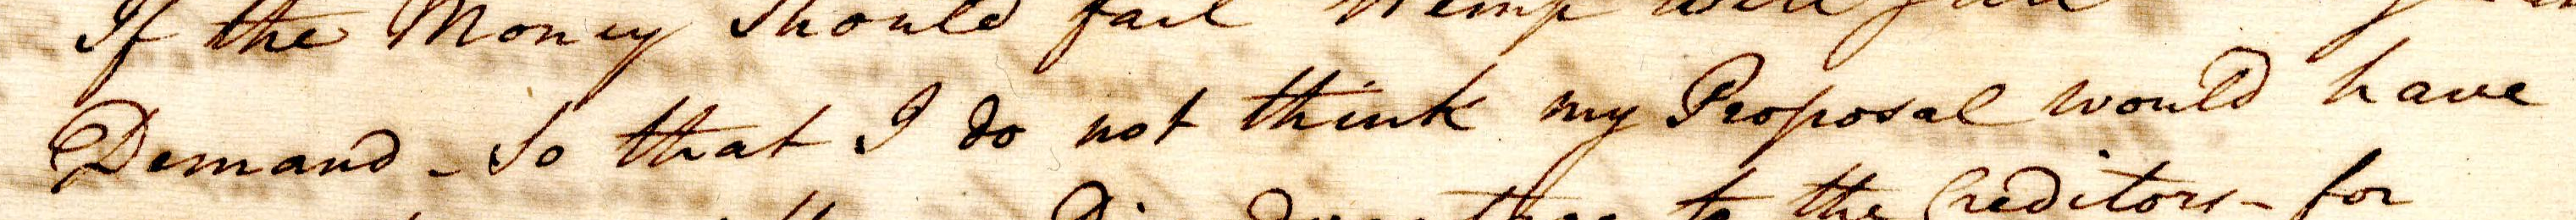Demand- So that I do not think my Proposal would have
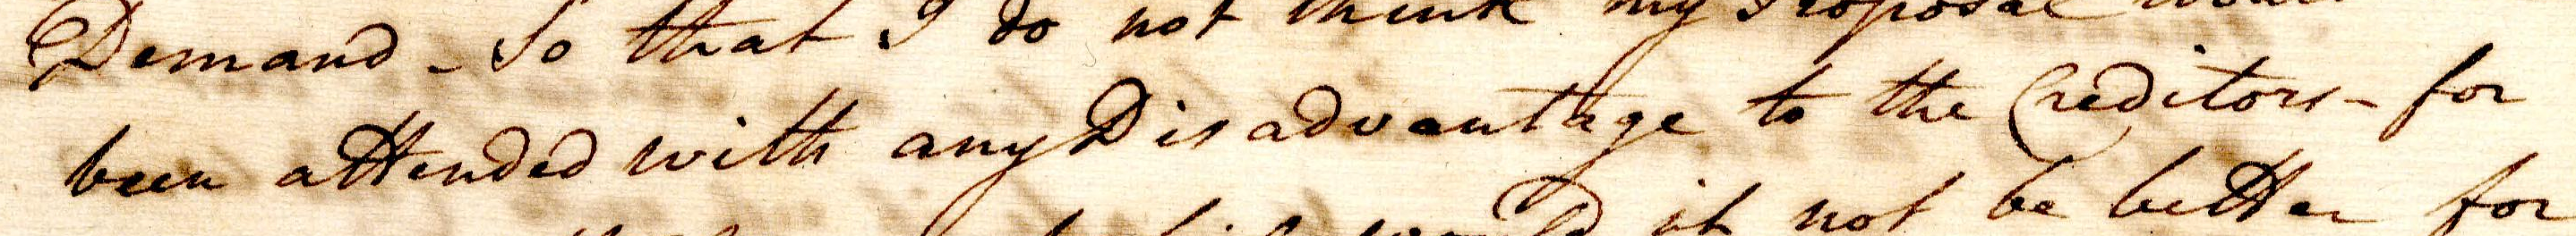been attended with any Disadvantage to the Creditors- for
